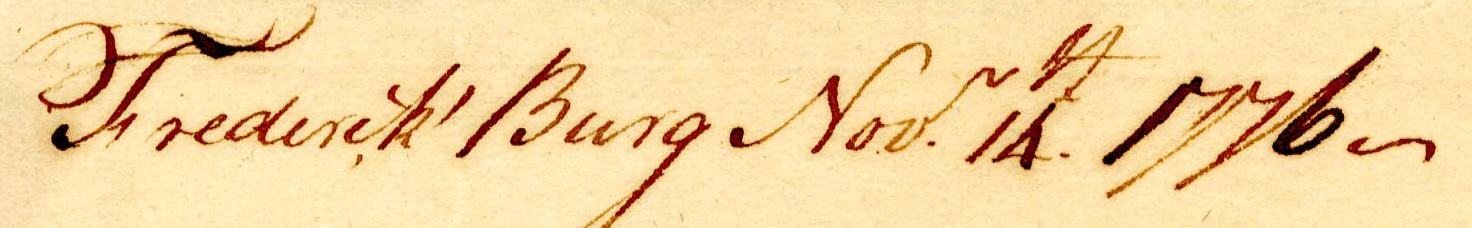FredericksBurg Nov^r 14^th. 1776-
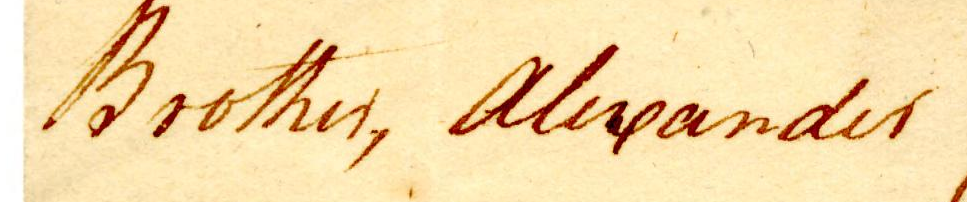Brother, Alexander
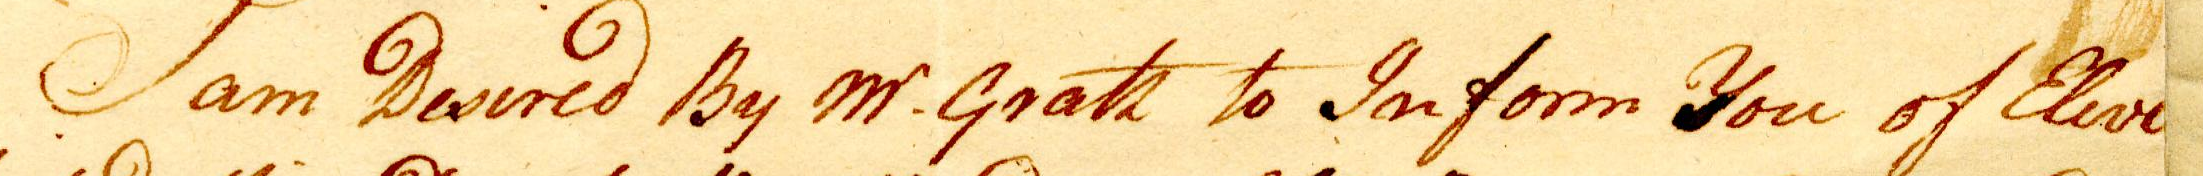I am Desired By M^r. Gratz to Inform you of Eleve
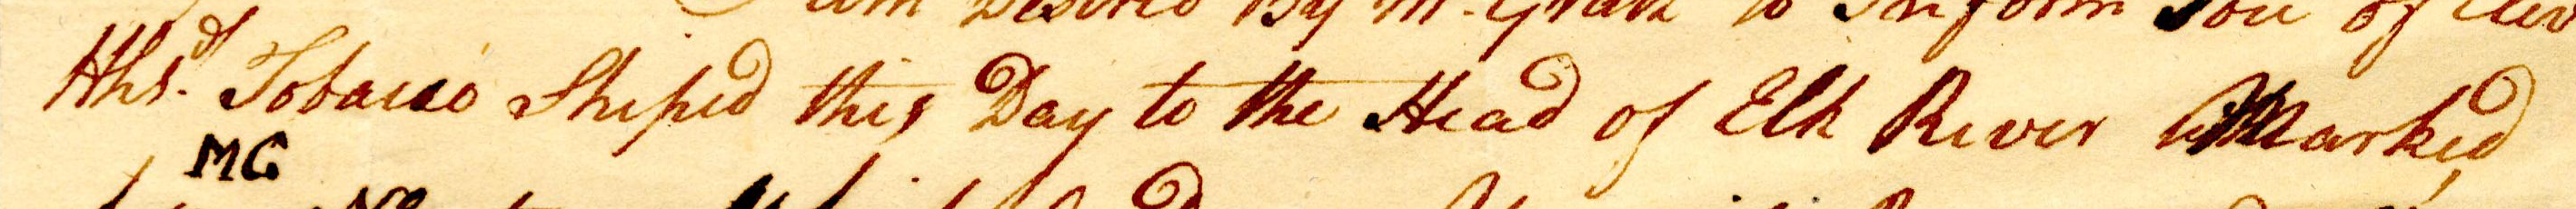Hhd^s. of Tobacco Shiped this Day to the Head of Elk River Marked
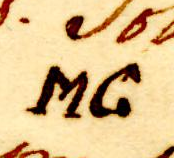MG
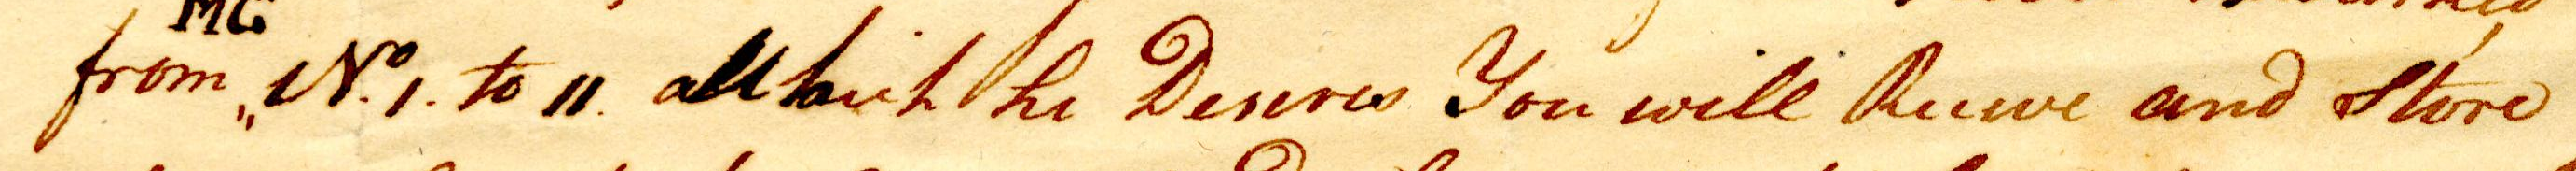from ^ N.^o. 1 to 11 Which he Desires You will Receve and Store
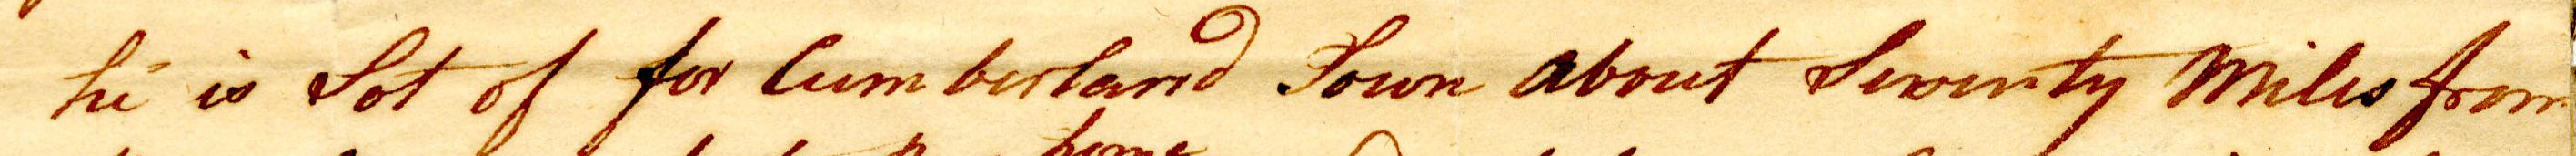he is Set of for Cumberland Town about seventy Miles from
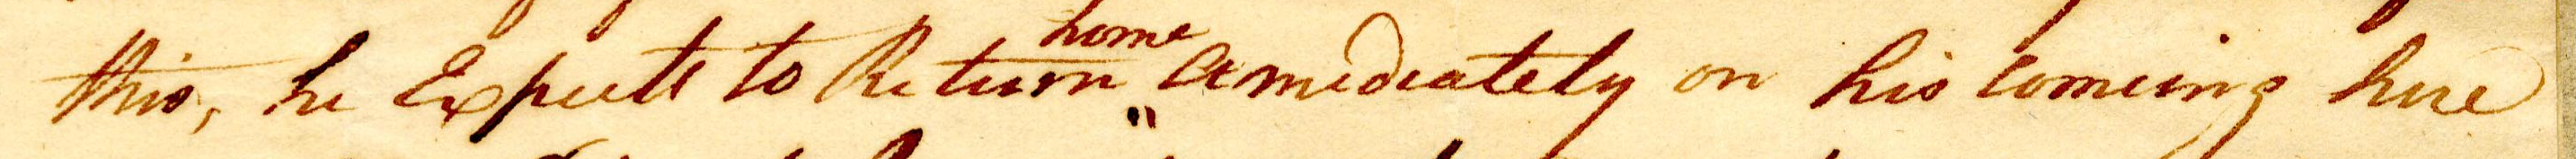this, he Expects to Return ^ Immediately on his comeing here
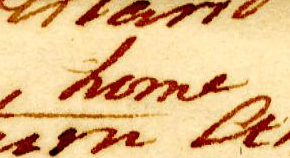home
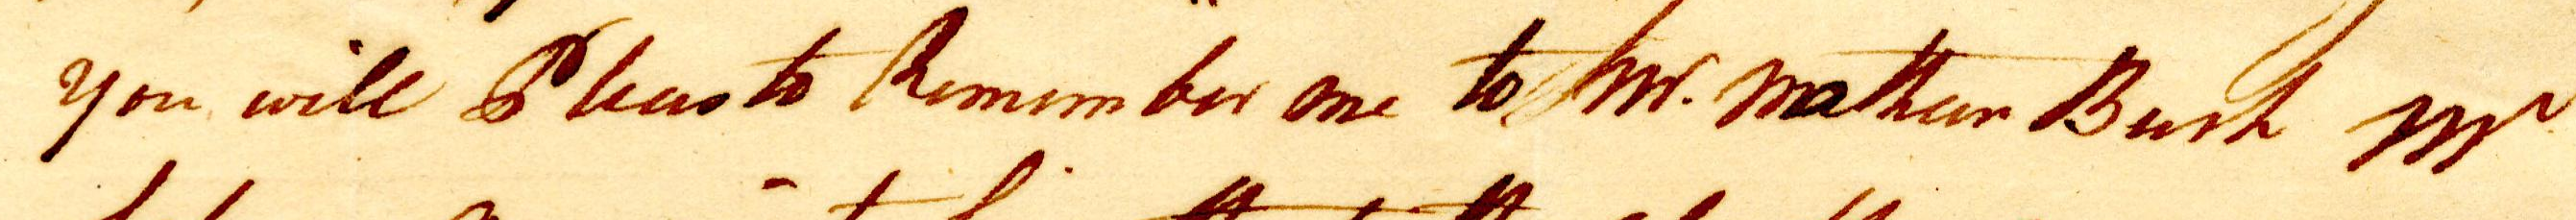you will Pleas to Remember one to M^r. Mathew Burk M^r
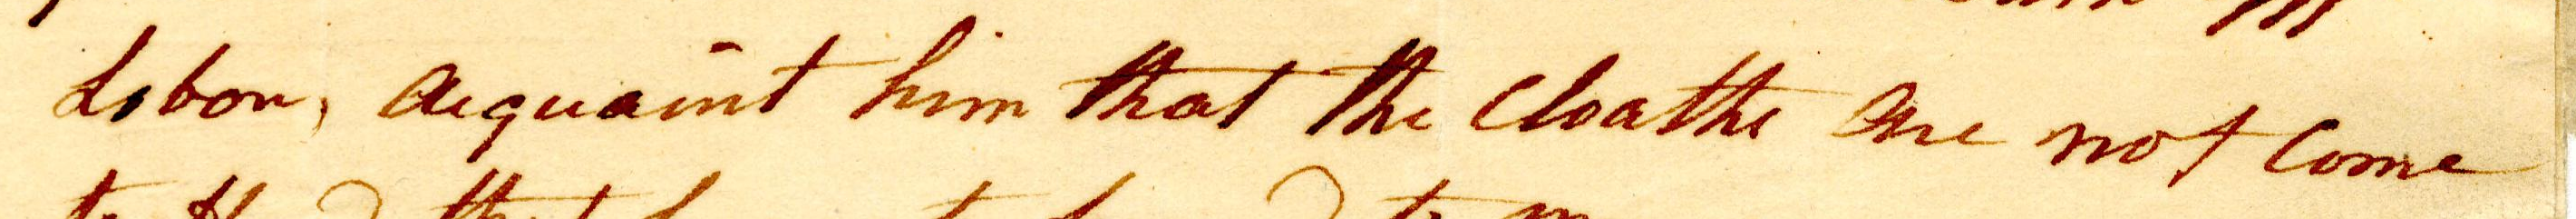Lebon, Acquaint him that the Cloaths are not come
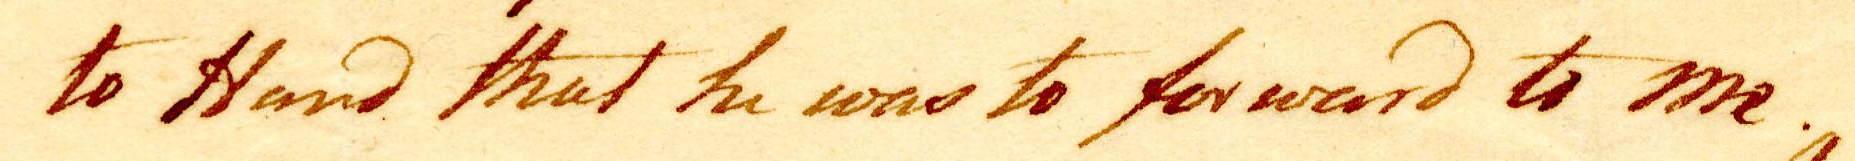to Hand that he was to forward to me
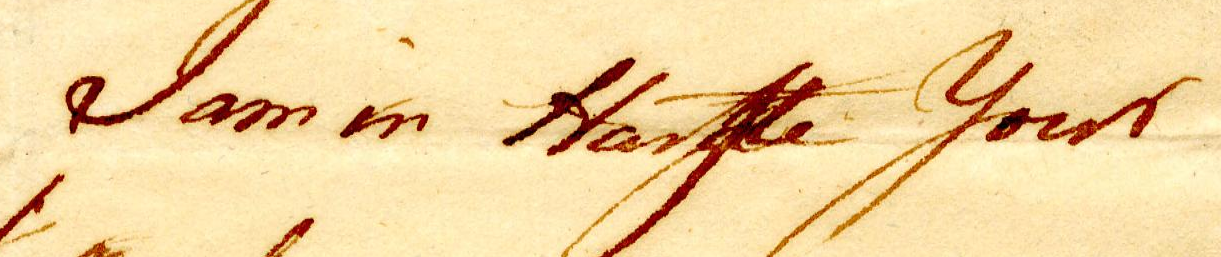I am in Haste Your
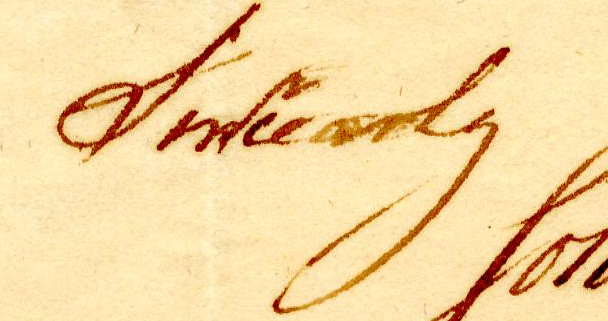Sincerly
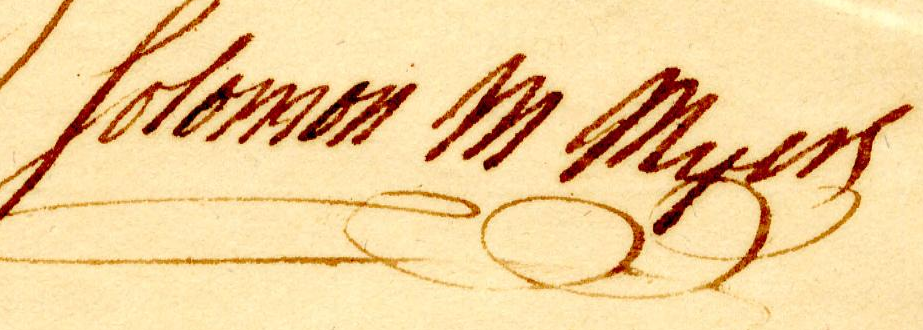Solomon M Myers
